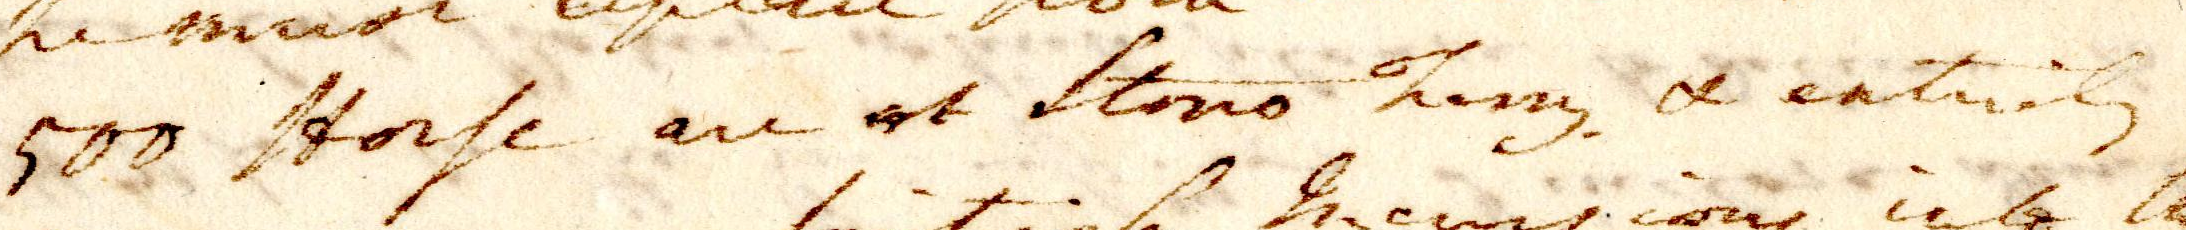500 Horse are at Stons Ferry & entirely
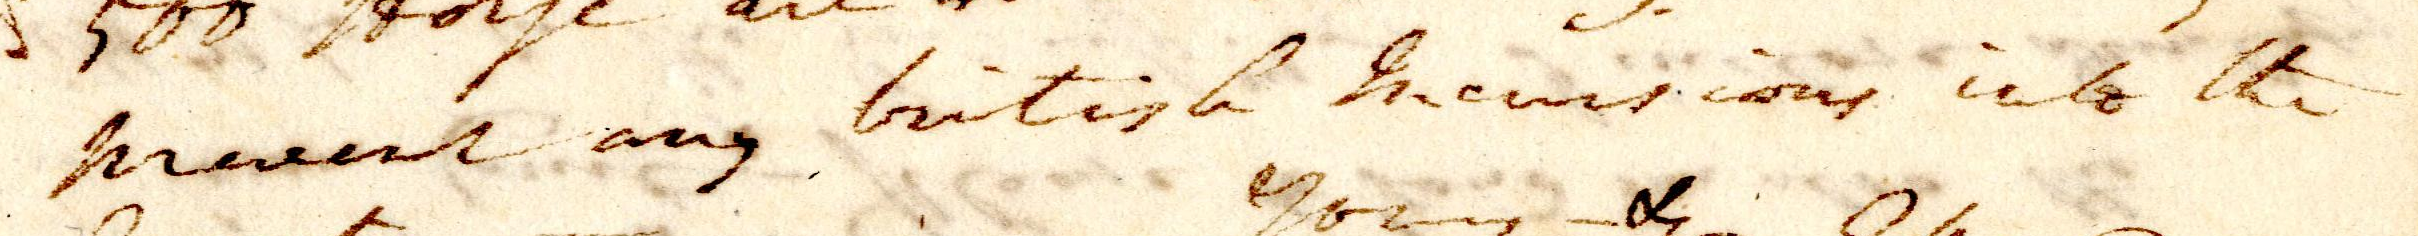prevent any british Incursions into the
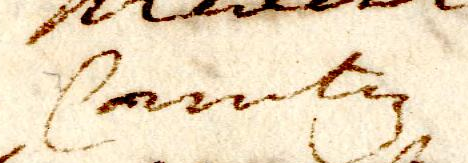Country
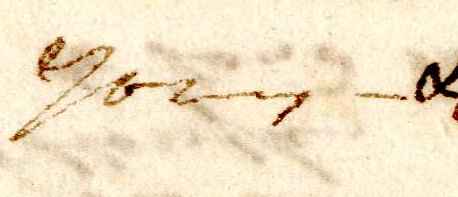Yours &c
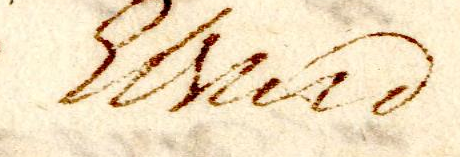E.Burd
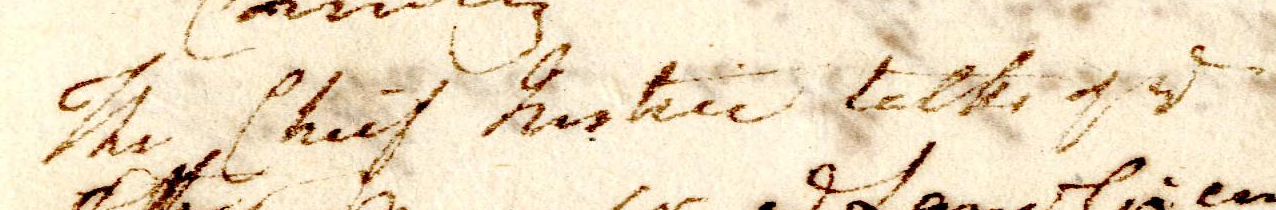The Chief Justice talks of y^e
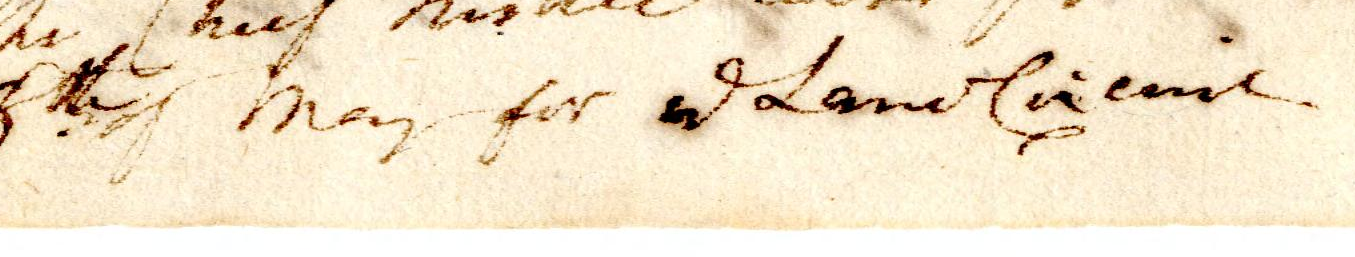8^th May for y^e Lane Circuit
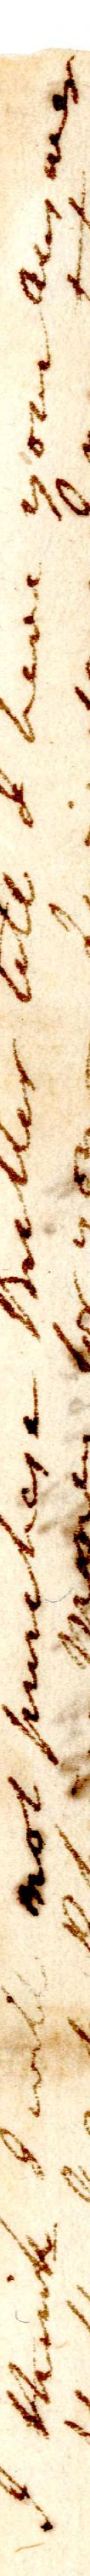I think I will not purchase Better till & have your Answer
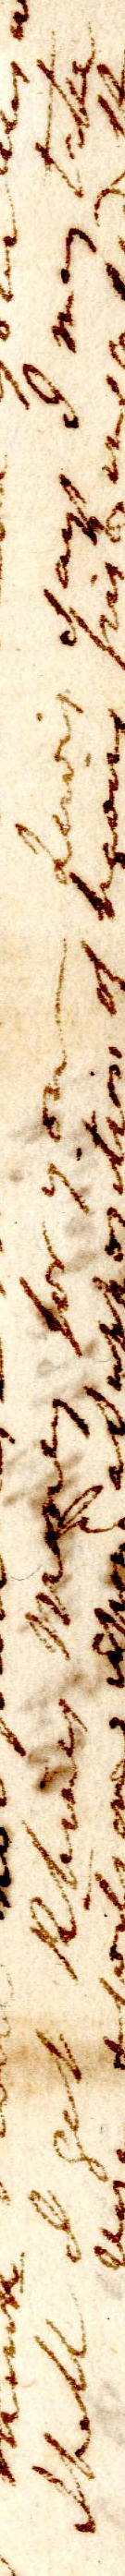shall I get Rhines money, for you. Lewis says I may take
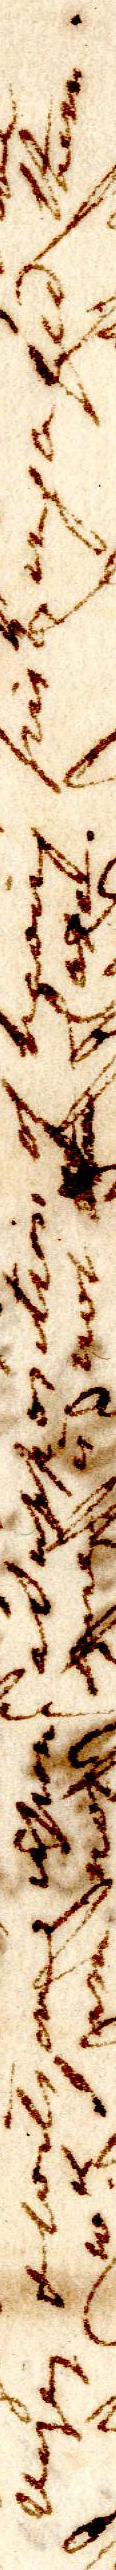vagey & will once upon asuppositions of having first engaged them
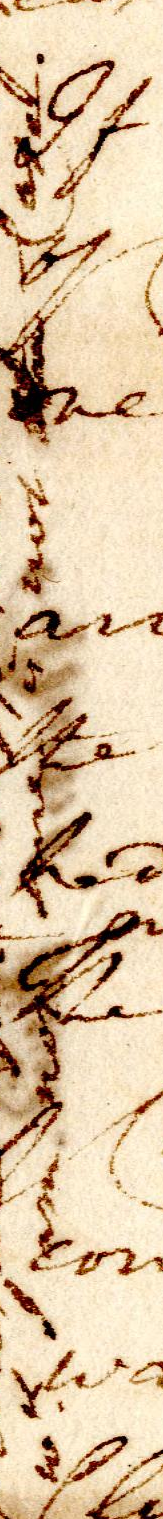w^ch I am now same is not the Case.
